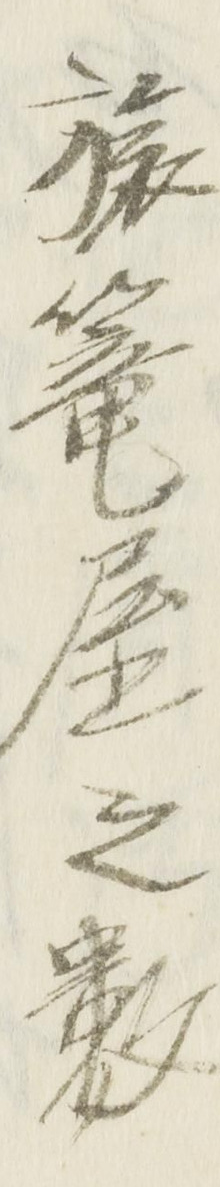旅籠屋之数
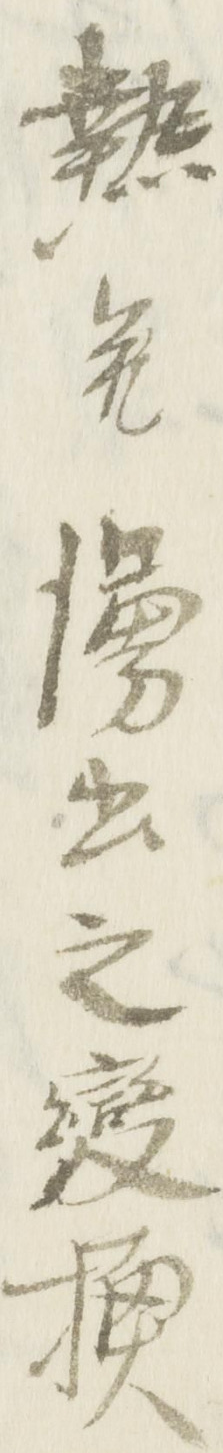熱并湧出之変換
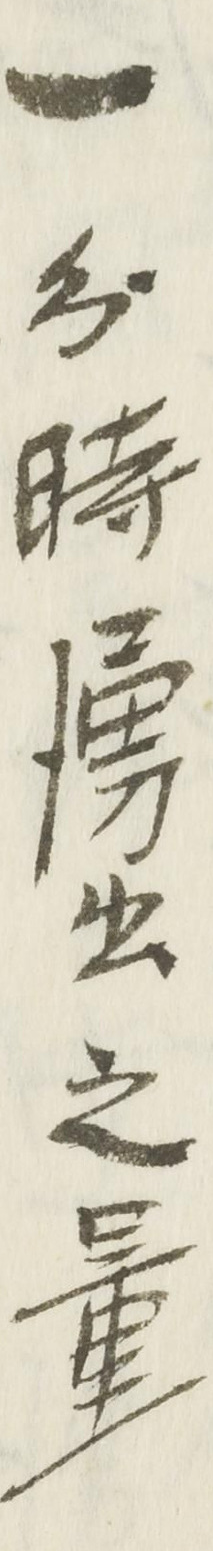一分時湧出之量
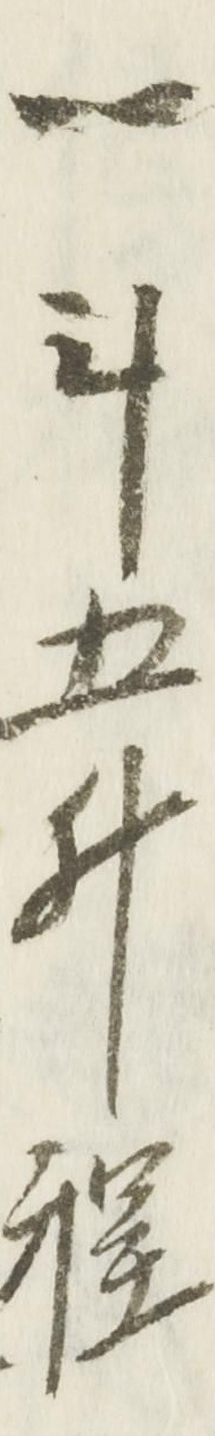一斗五升程
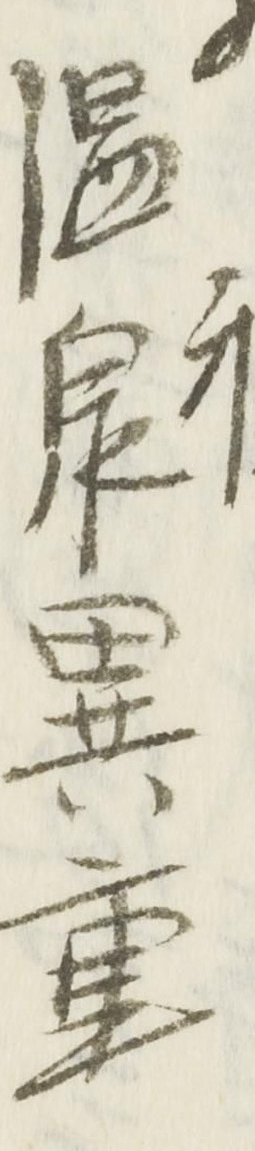温泉異重
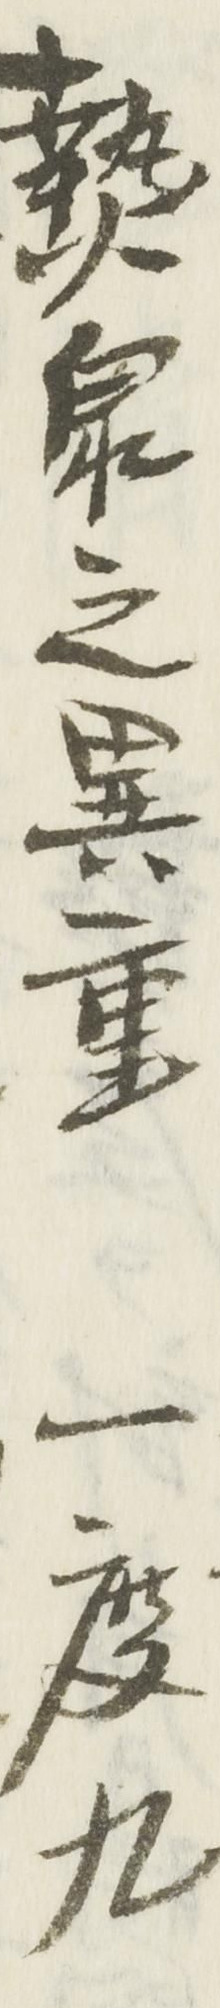熱泉之異重一度九
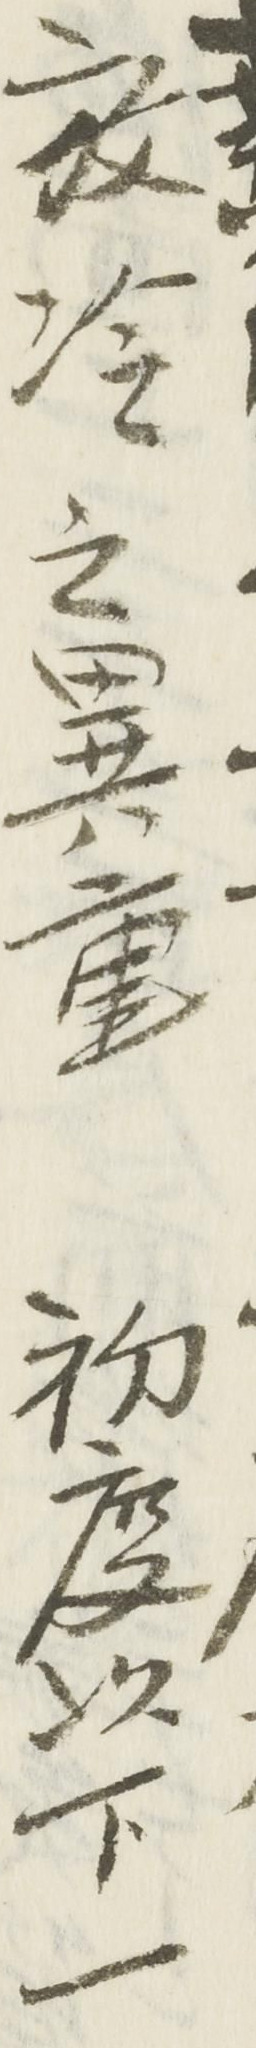放冷之異重初度以下一
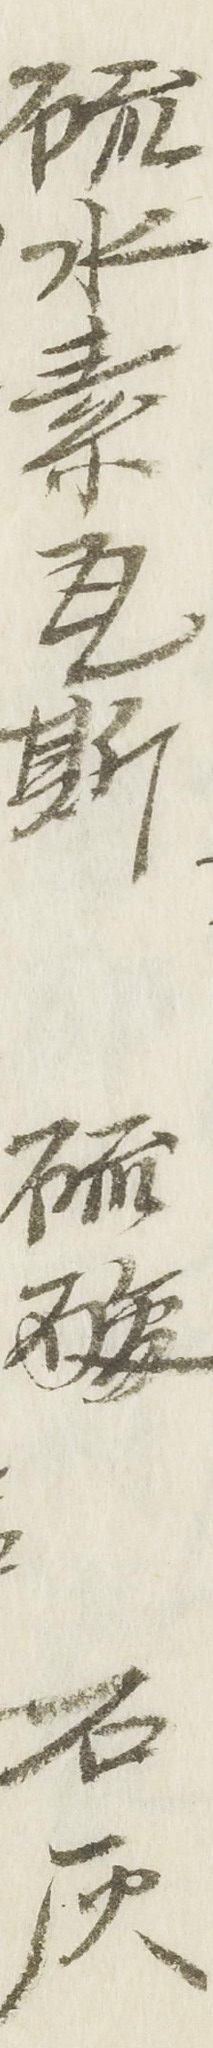硫水素瓦斯硫酸石灰
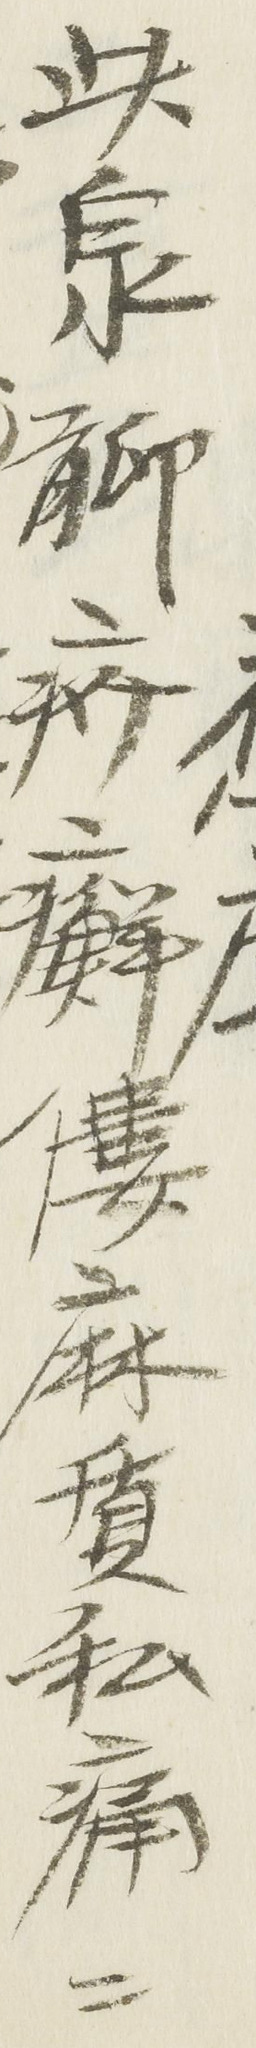此泉聊疥癬麻質私痛ニ
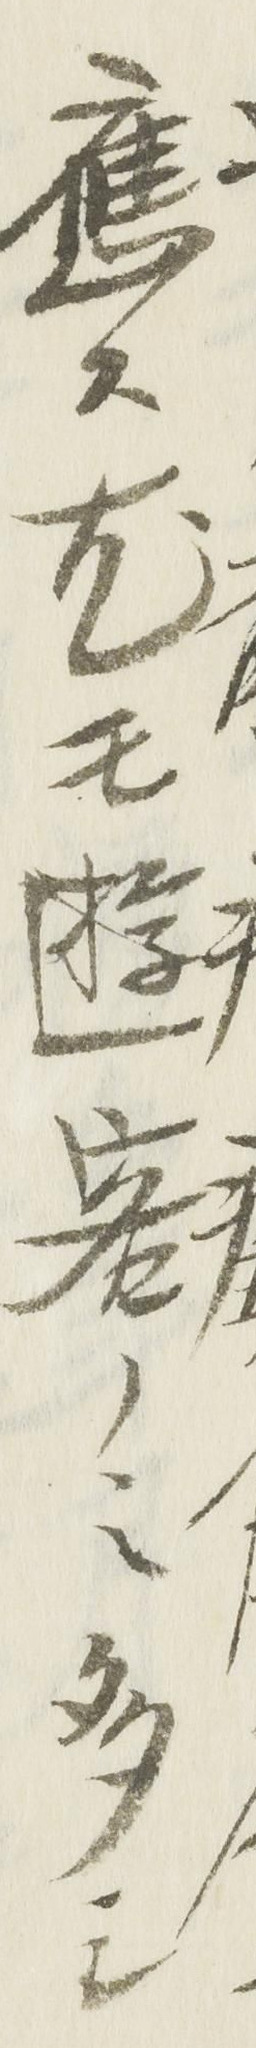応ス尤モ遊客ノミ多シ

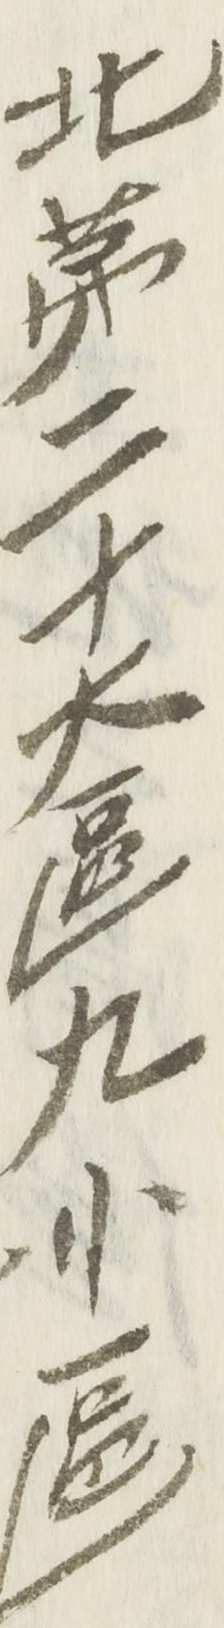北第二十大区九小区
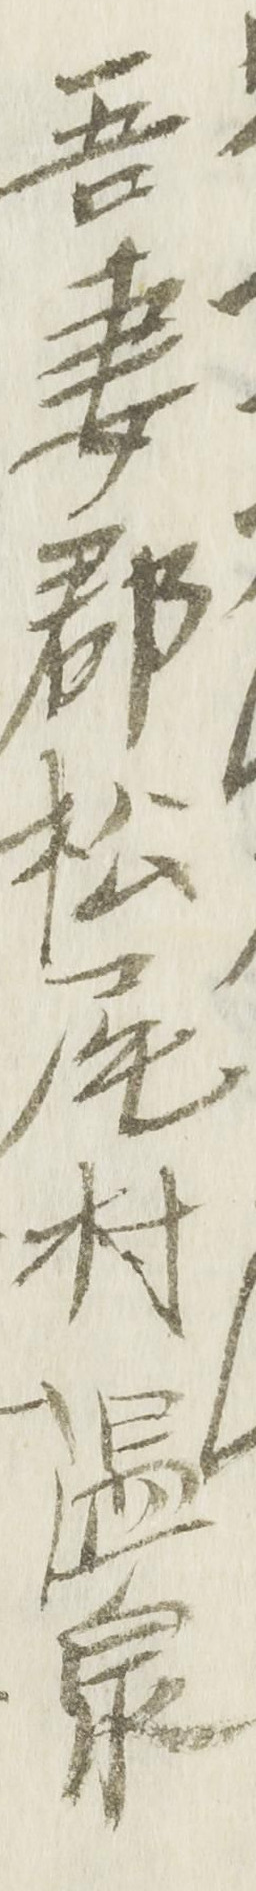吾妻郡松尾村温泉
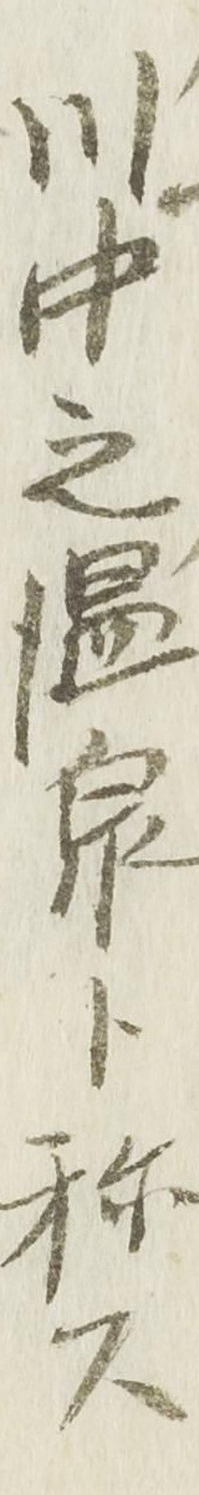川中之温泉ト称ス
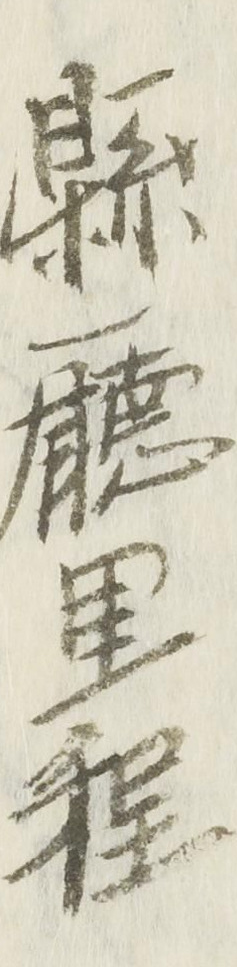県庁里程
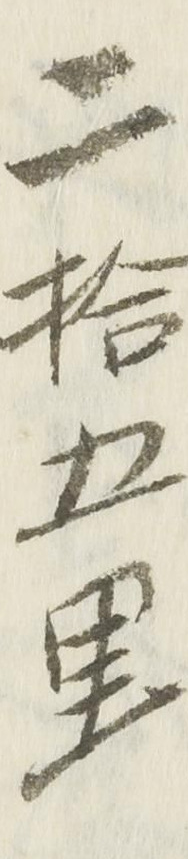二拾五里
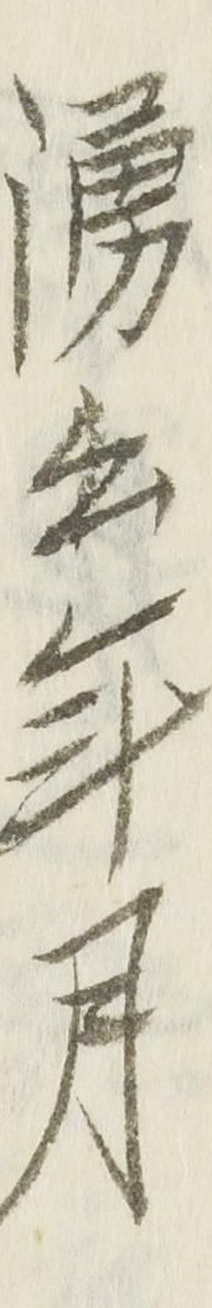湧出年月
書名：温冷泉試験表
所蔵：東京大学地震研究所図書室 Earthquake Research Institute Library, The University of Tokyo, JAPAN
